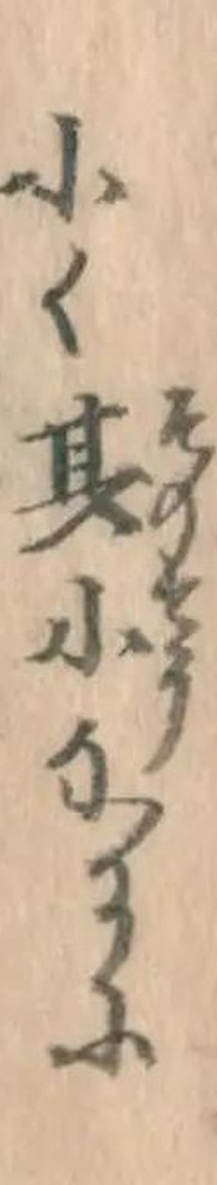小く其小なるに
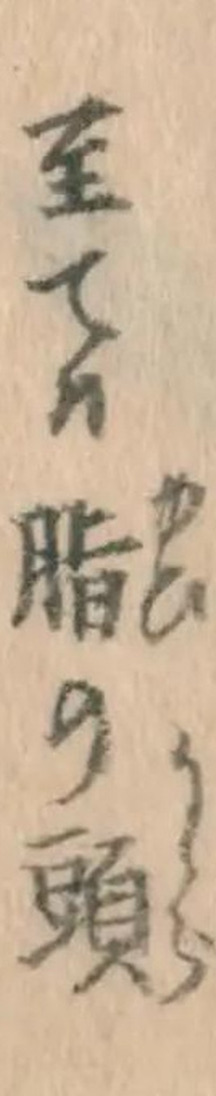至ては脂の頭
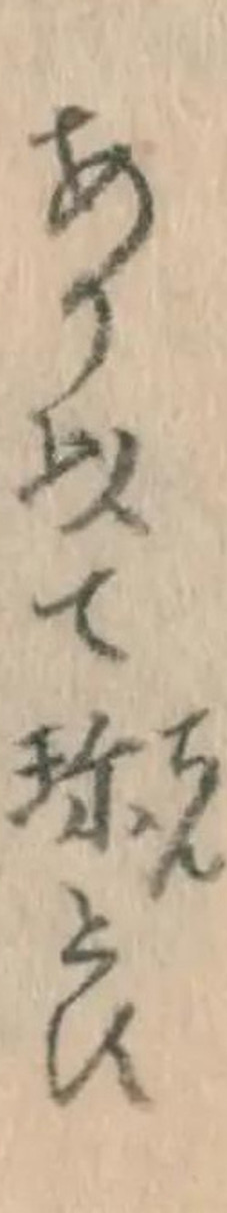あり以て珎とす
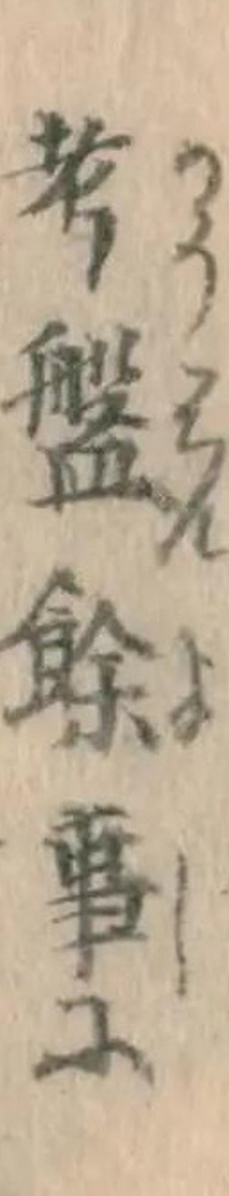考盤余事に
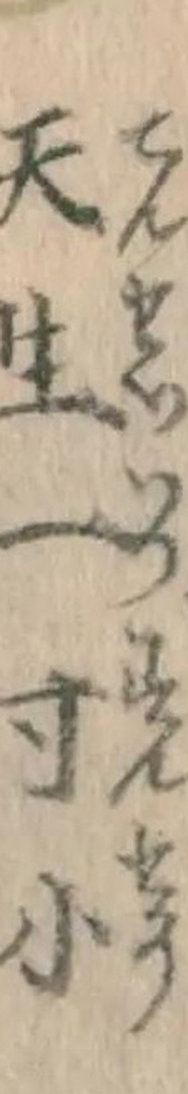天生一寸小
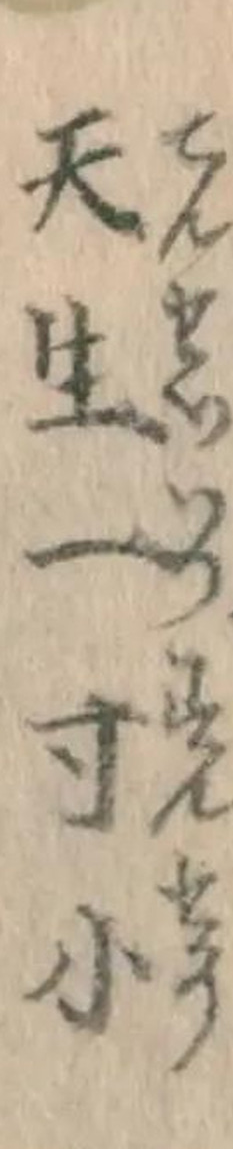天生一寸小
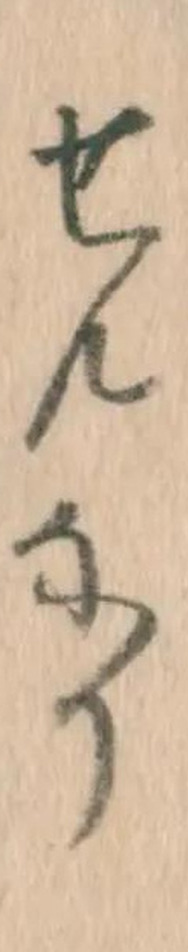せんなり
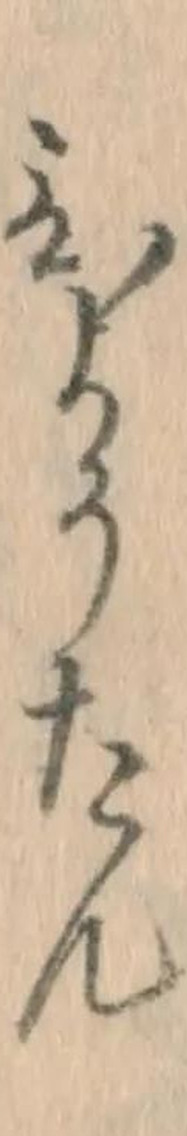ひようたん
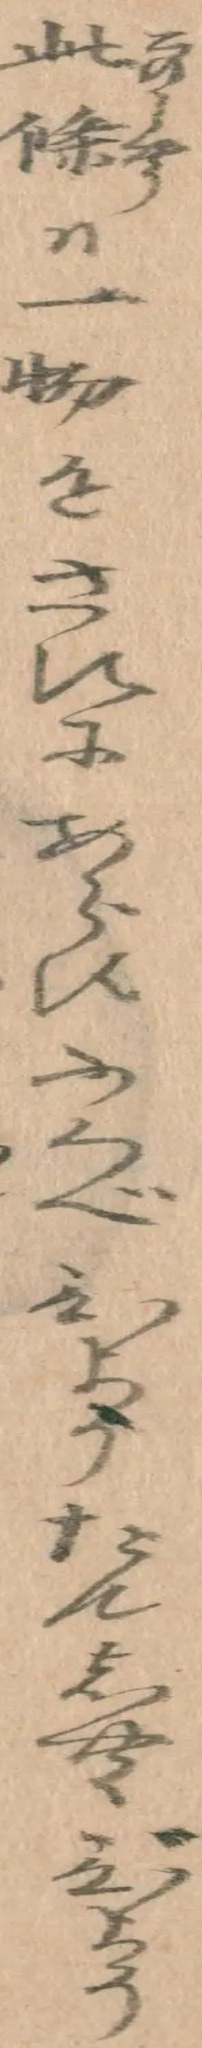此条は一物をさすにあらすふくべひようたんしやくびよう
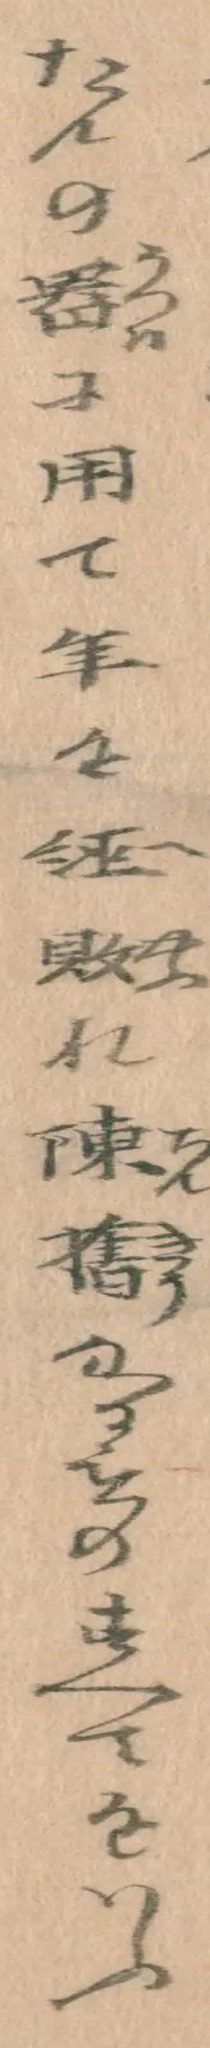たんの器に用て年を経敗れ陳旧なるものすへてをいふ

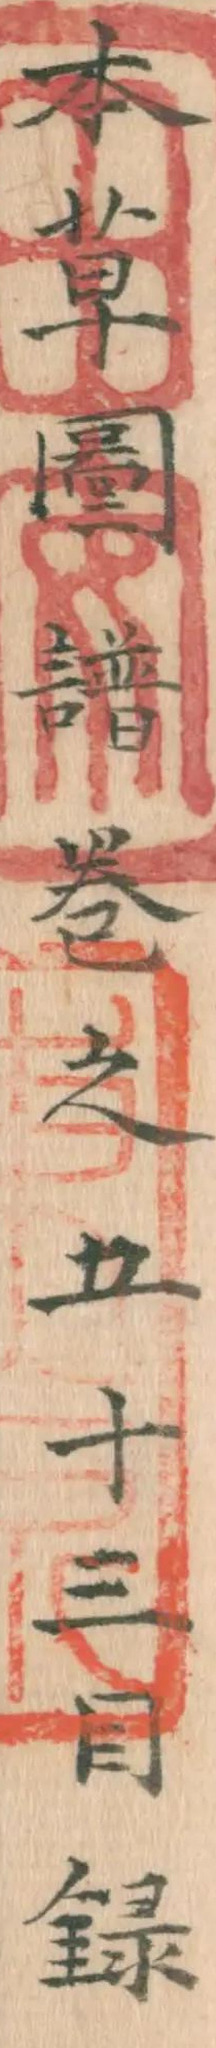本草図譜巻之五十三目録

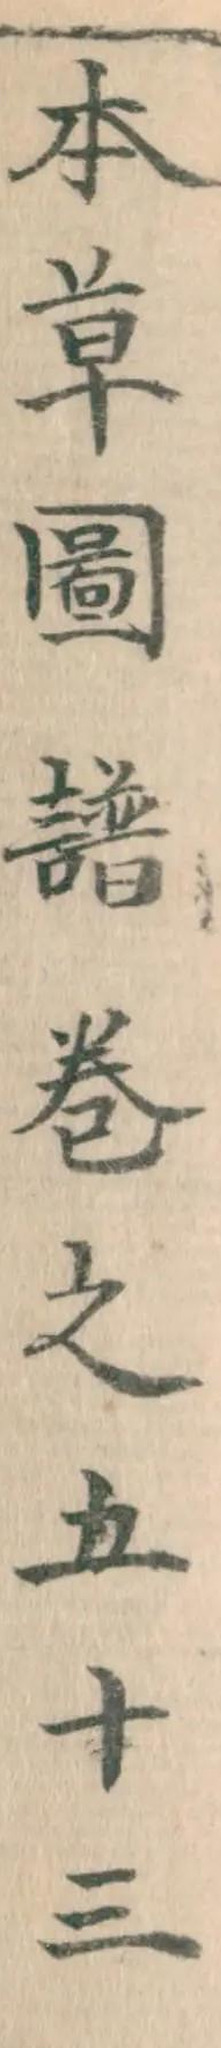本草図譜巻之五十三
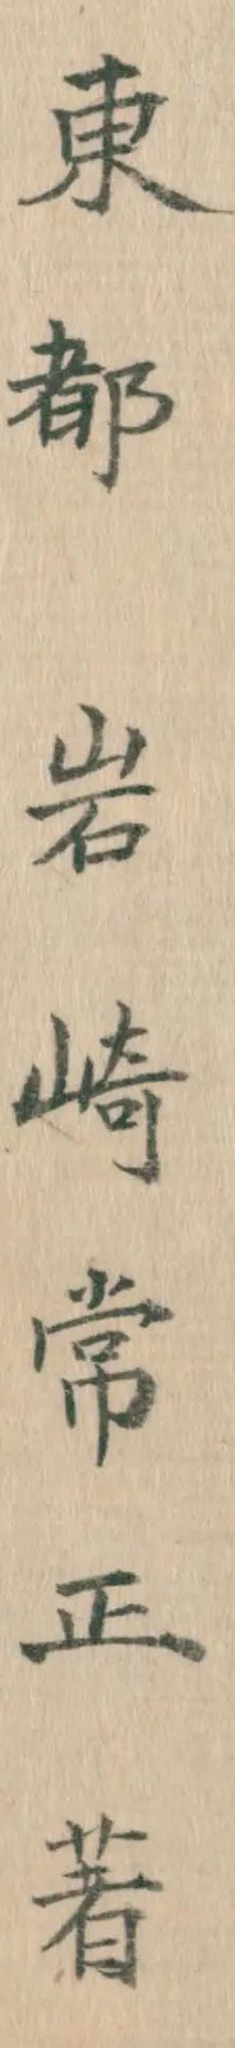東都岩崎常正著
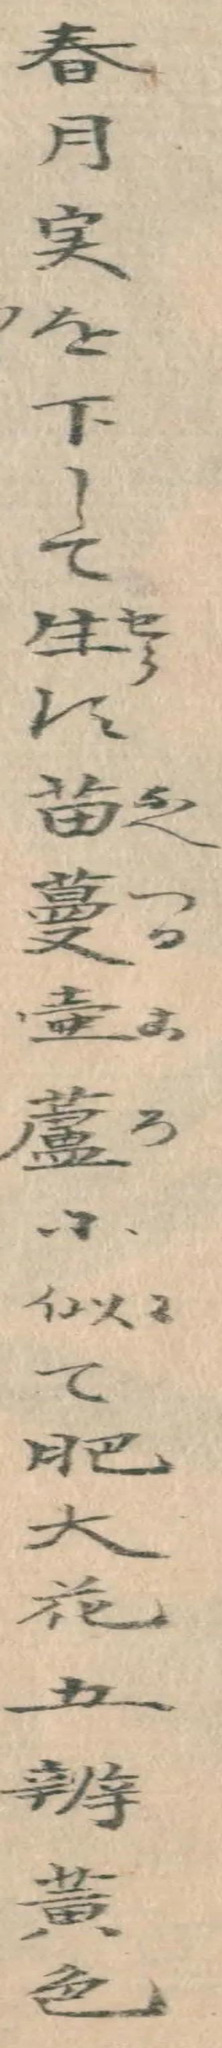春月実を下して生す苗蔓壺芦に似て肥大花五弁黄色
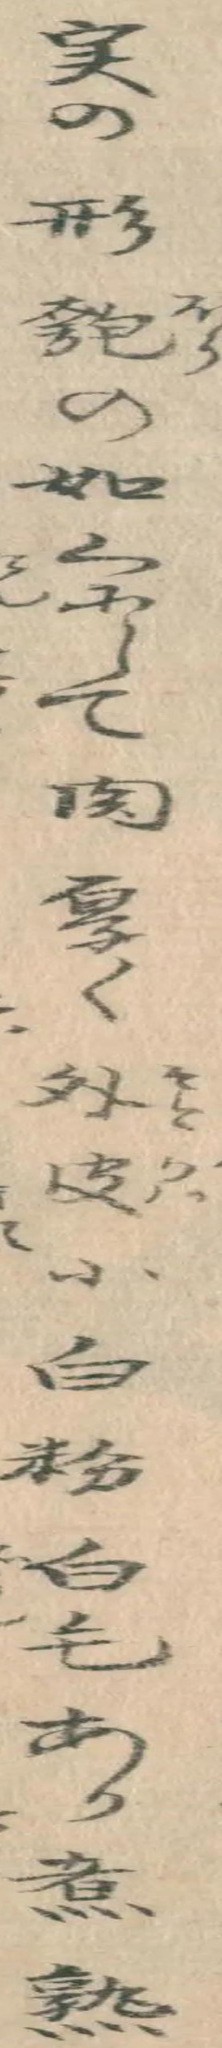実の形匏の如くにして肉厚く外皮に白粉白毛あり煮熟
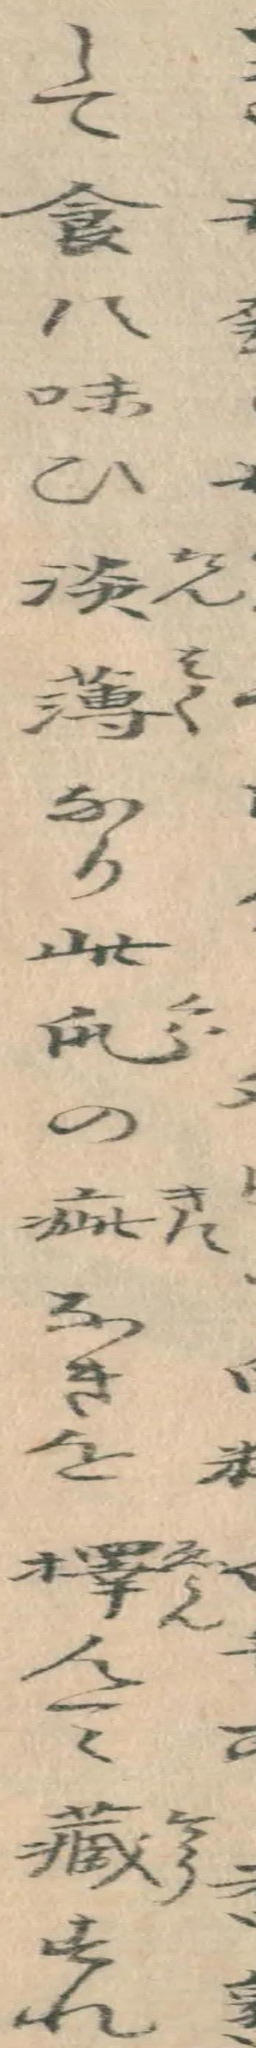して食す味ひ淡薄なり此瓜の疵なきを択んて蔵すれ
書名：本草図譜. 巻52-54
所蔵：国立国会図書館 National Diet Library, JAPAN
